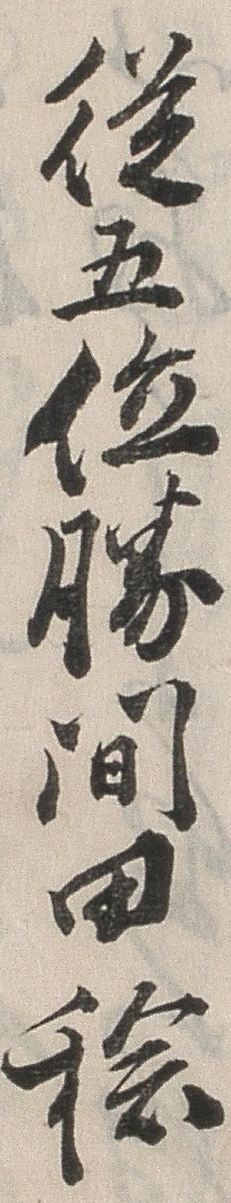従五位勝間田稔
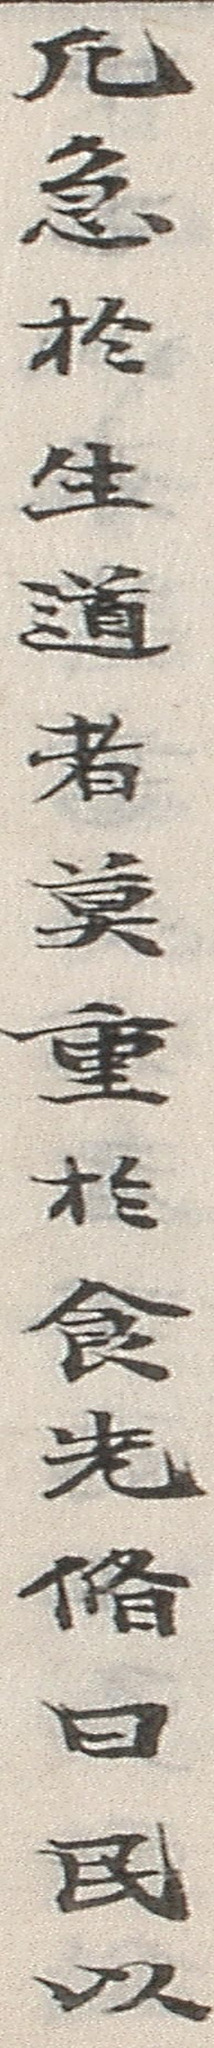凡急於生道者莫重於食先脩日民以
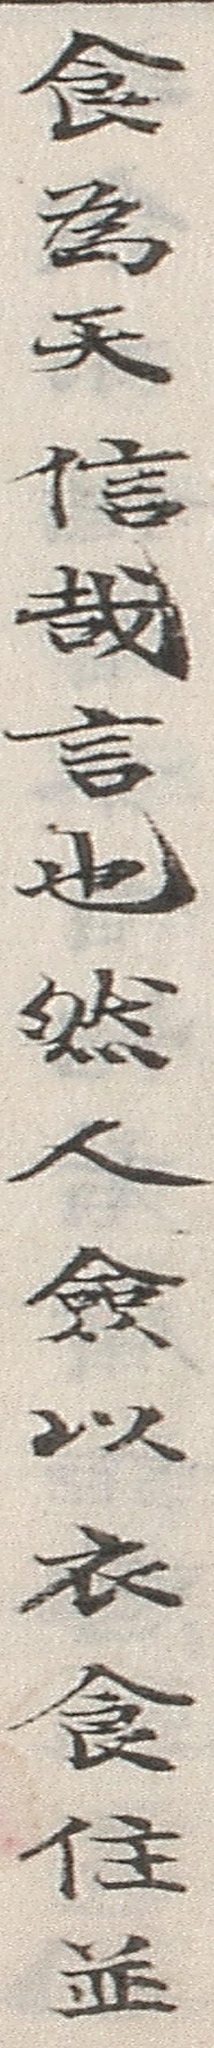食為天信哉言也然人僉以衣食住並
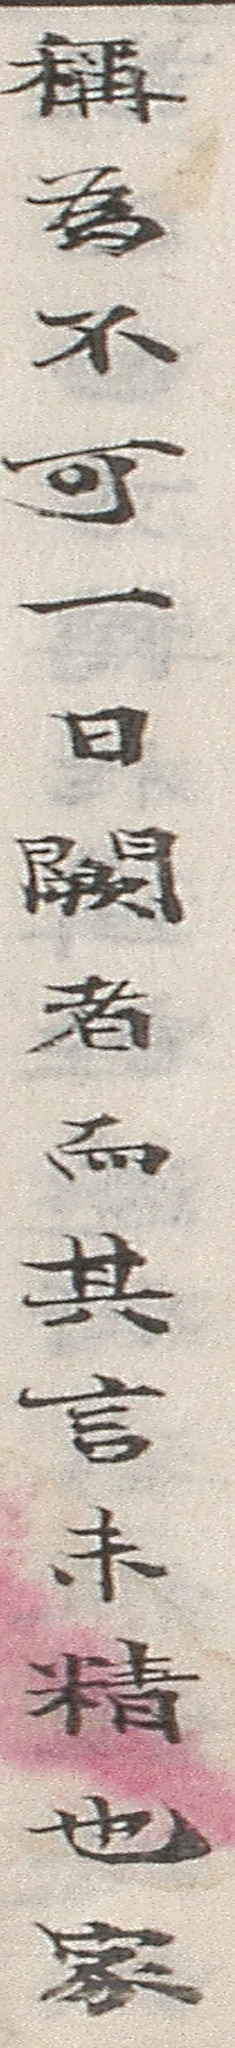稱為不可一日闕者而其言未精也家
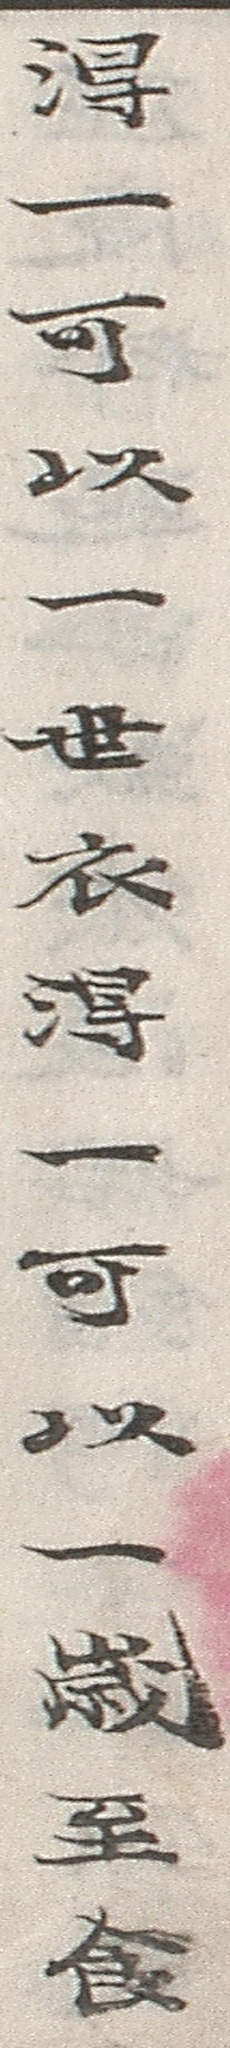得一可以一世衣得一可以一歳至食
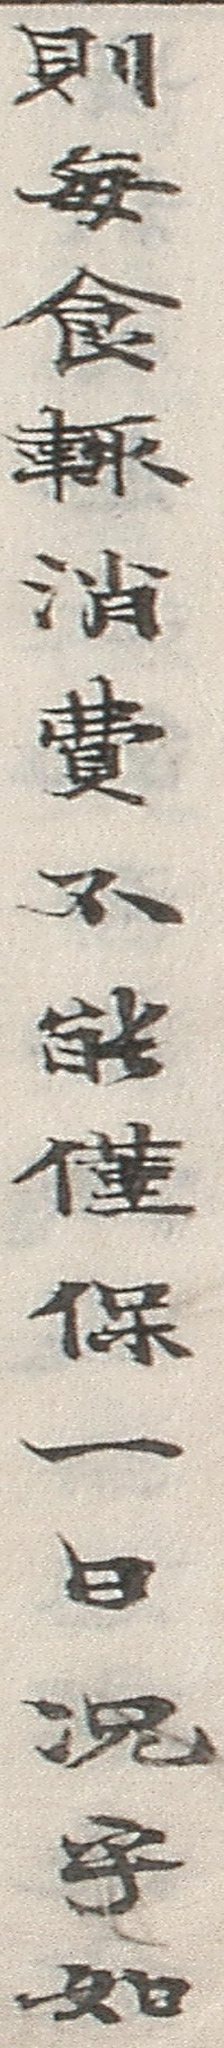則毎食輙消費不能僅保一日况乎如
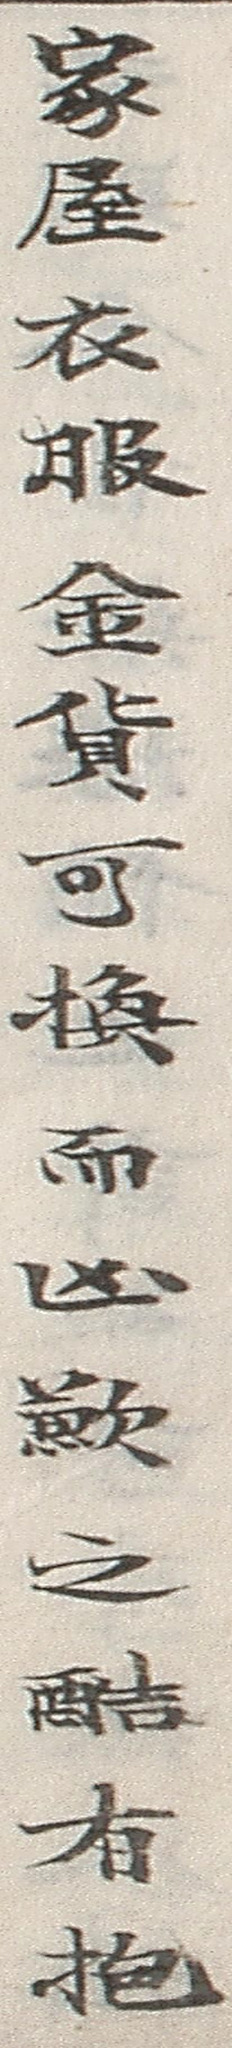家屋衣服金貨可換而凶歉之酷有抱
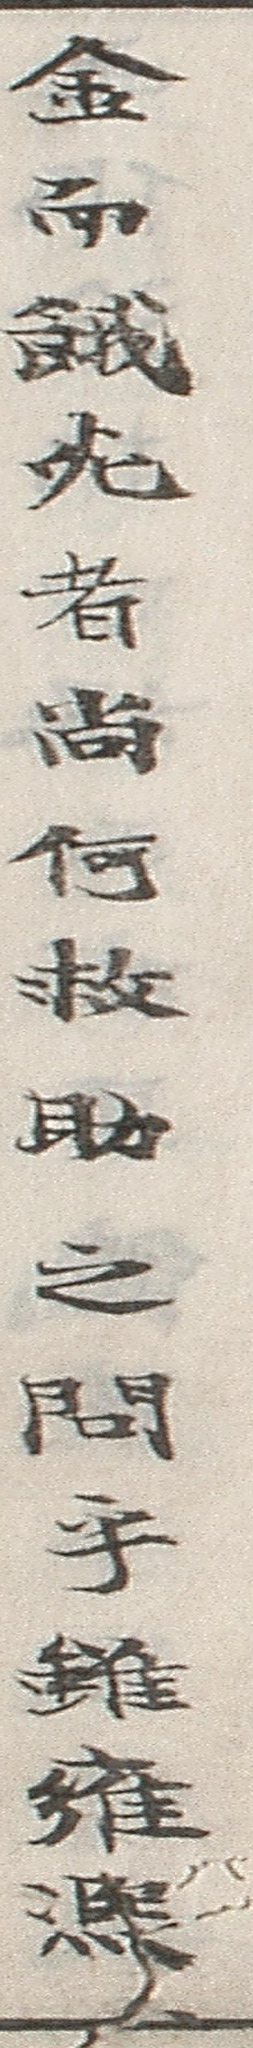金而餓死者尚何救助之問乎雖雍凞

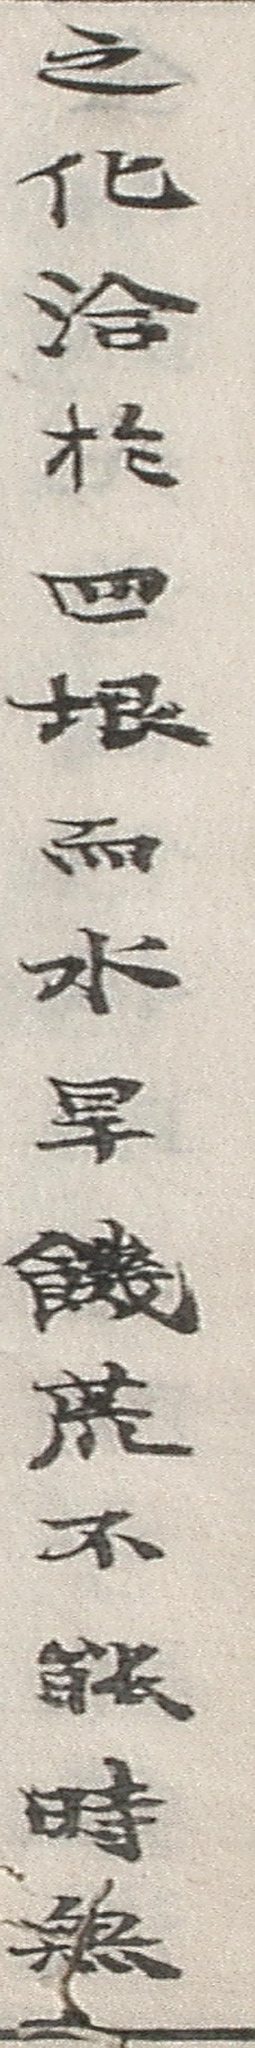之化洽於四垠而水旱饑荒不能時無
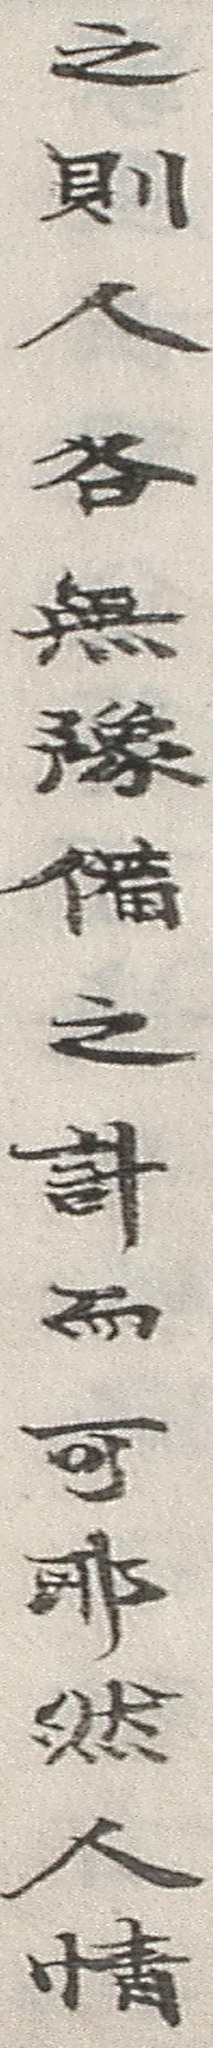之則人各無豫備之計而可耶然人情
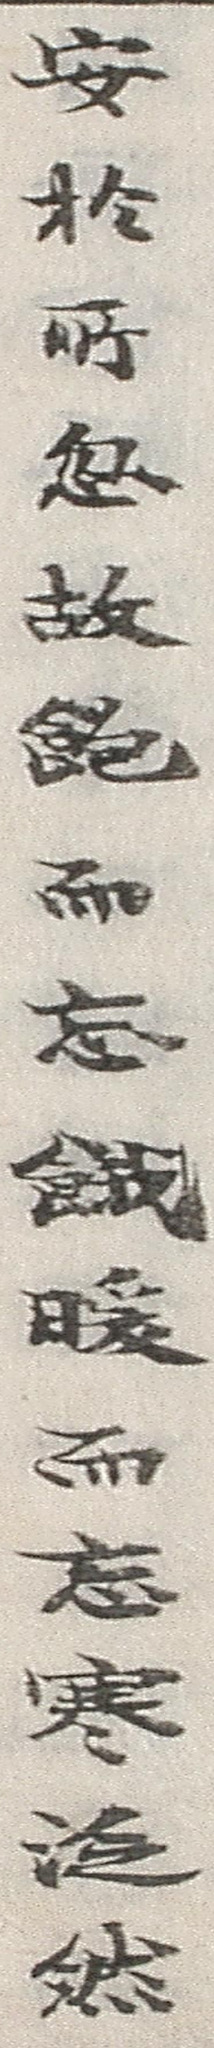安於所忽故飽而忘餓暖而忘寒泛然
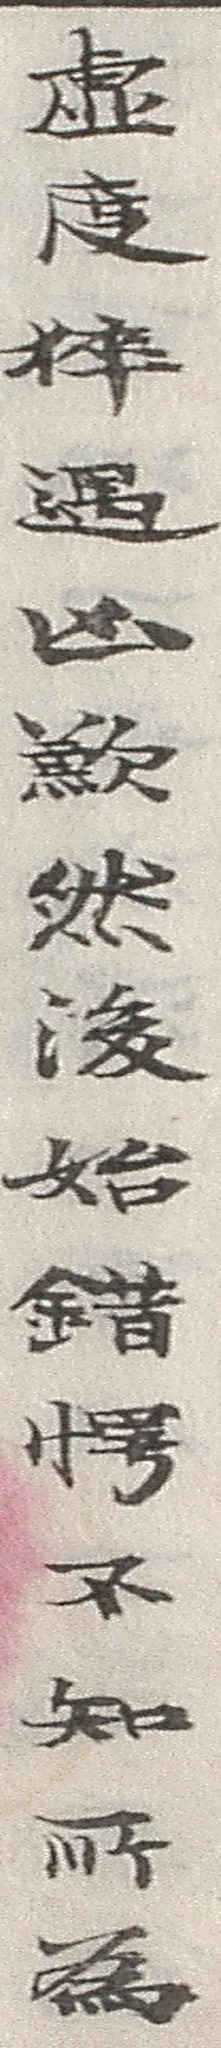虚度猝遇凶歉然後始錯愕不知所為
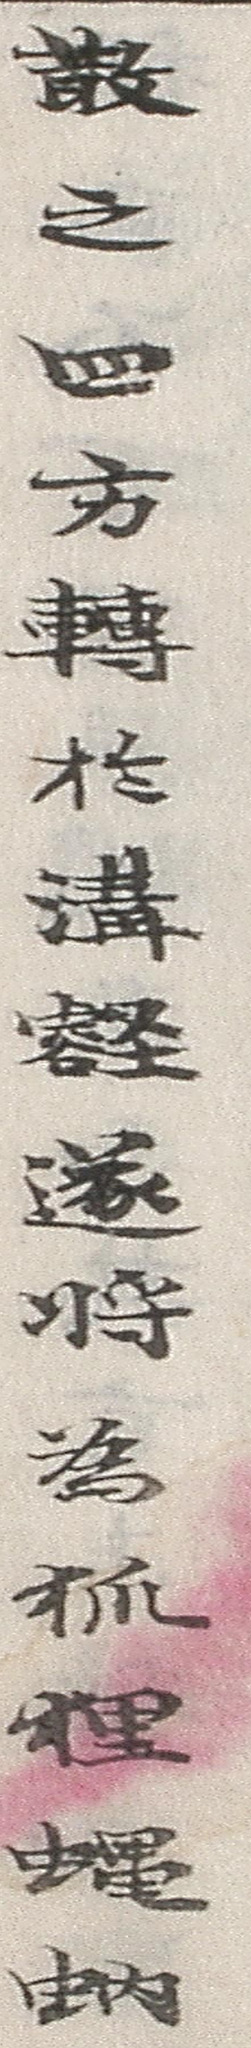散之四方転於溝叡遂将為狐狸蝿蚋
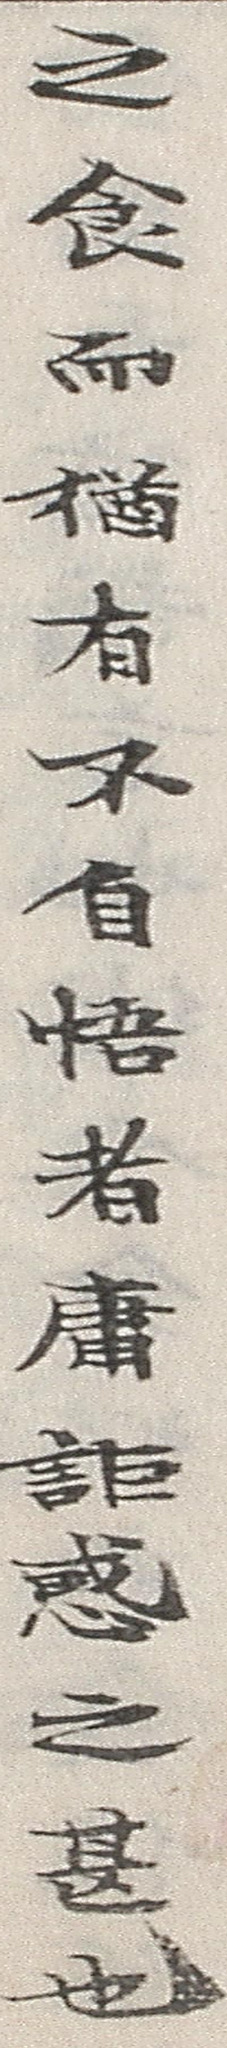之食而猶有不自悟者庸詎惑之甚也
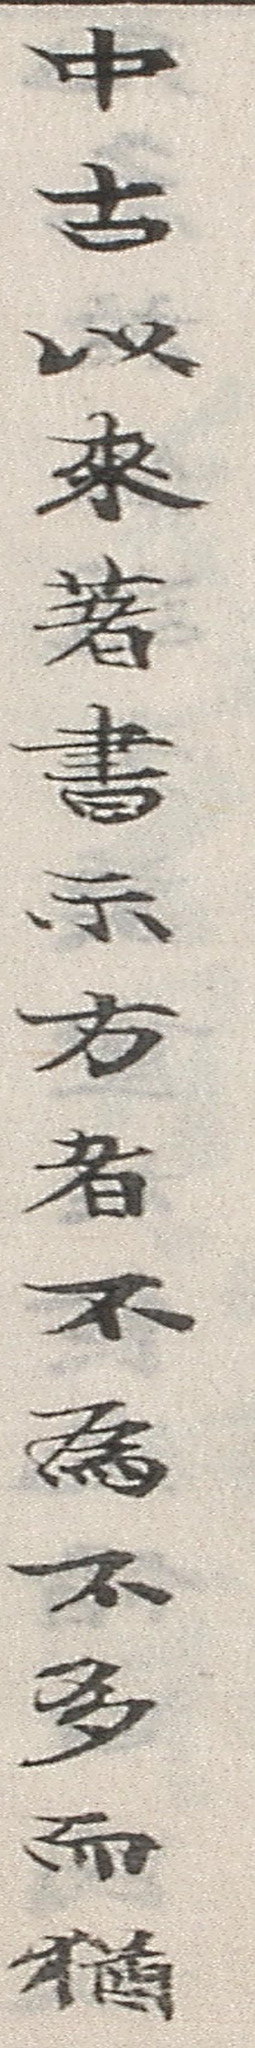中古以来著書示方者不為不多而猶
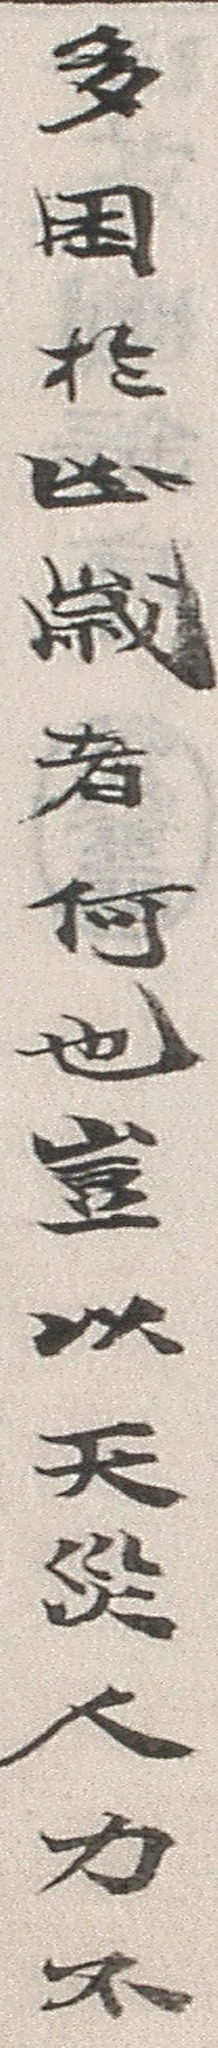多困於凶歳者何也豈以天災人力不
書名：凶荒図録　完
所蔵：東京大学地震研究所図書室 Earthquake Research Institute Library, The University of Tokyo, JAPAN
